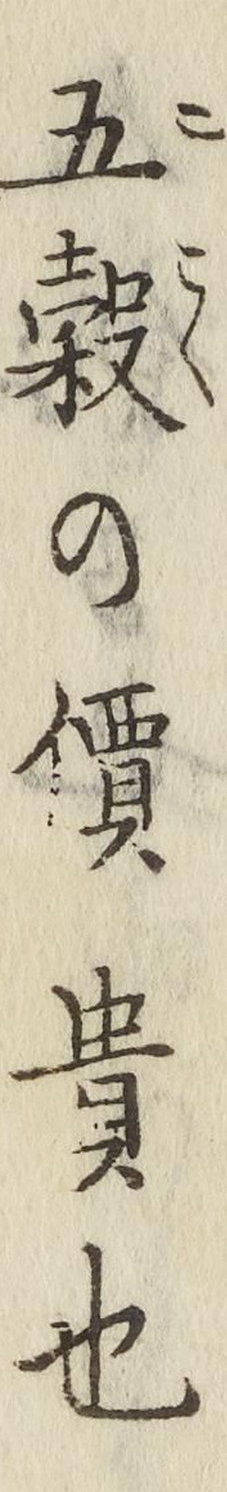五穀の価貴也
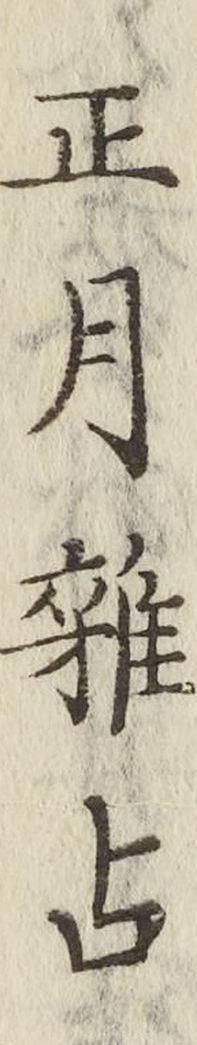正月雑占
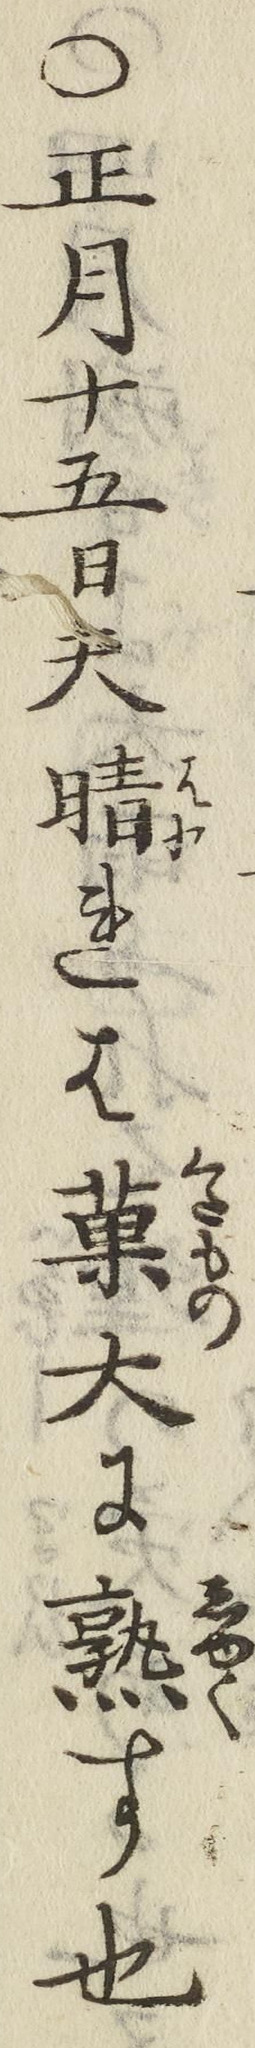〇正月十五日天晴れは菓大に熟す也
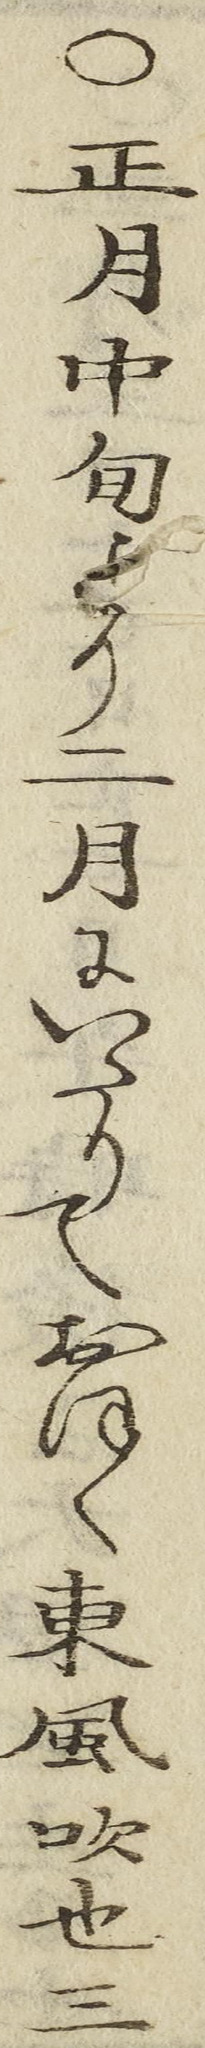〇正月中旬より二月にいたりておほく東風吹也三
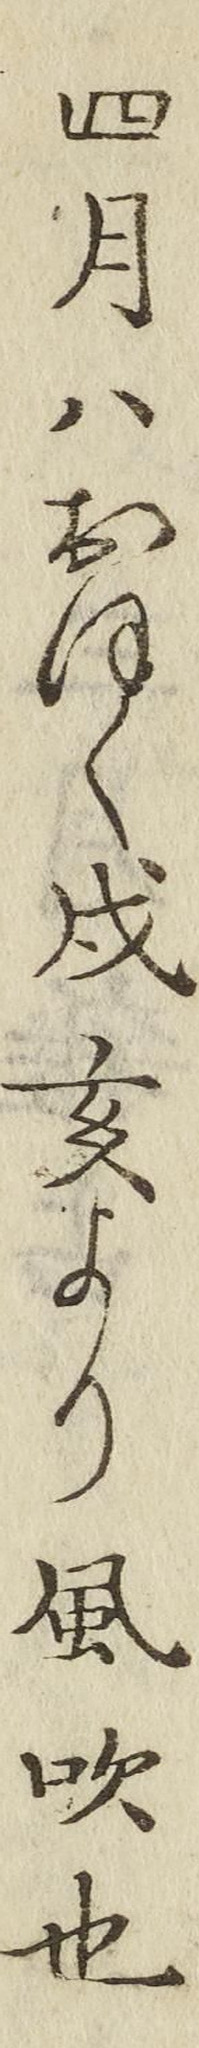四月はおほく戌亥より風吹也
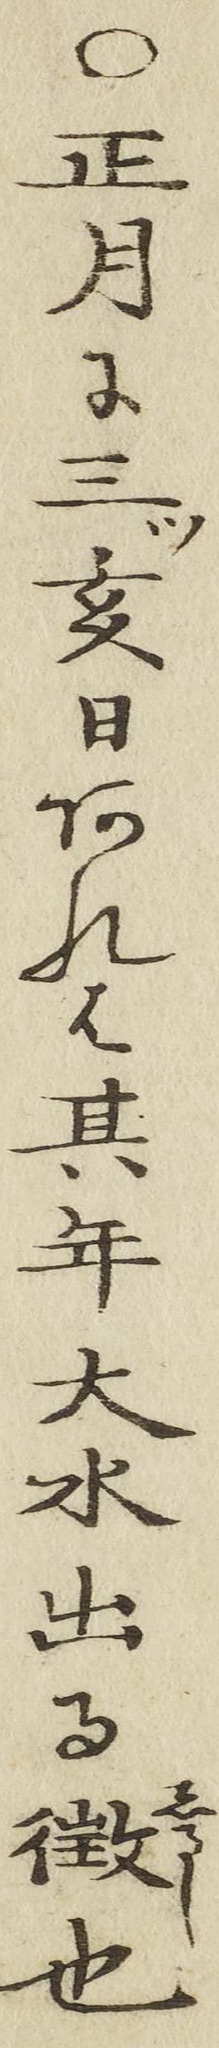〇正月に三ッ亥日あれは其年大水出る徴也
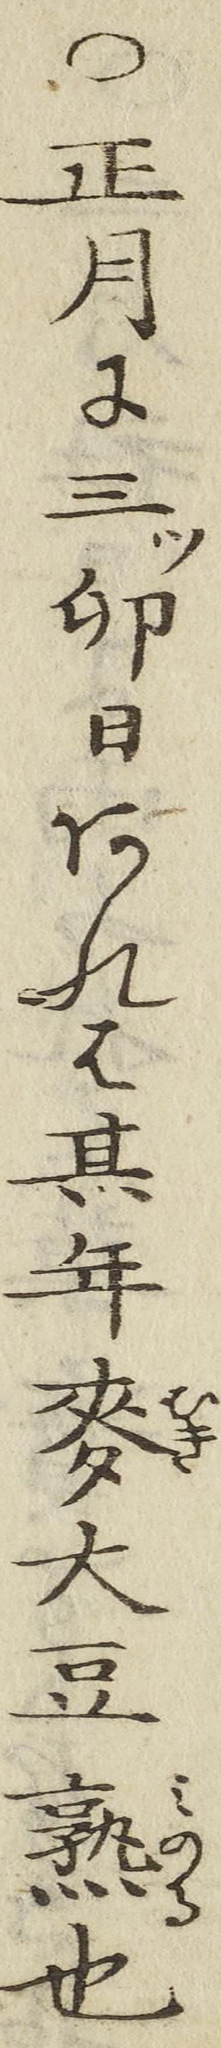〇正月に三ッ卯日あれは其年麦大豆熟也
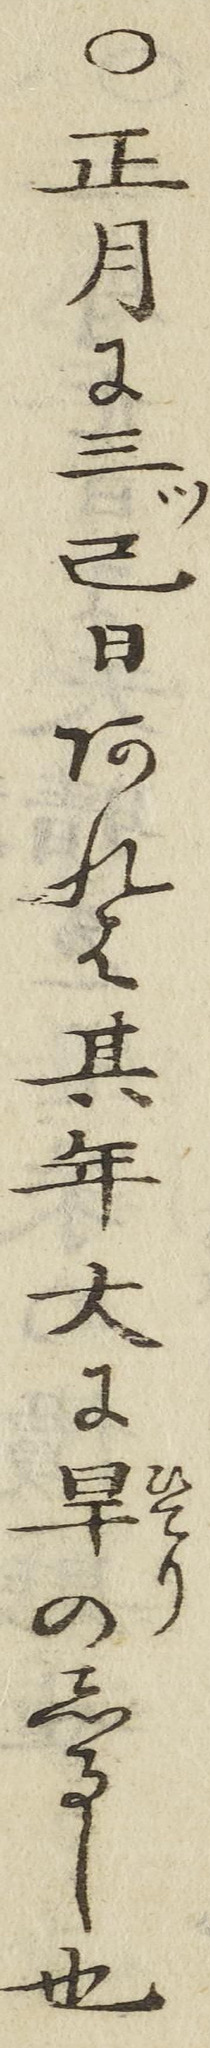〇正月に三ッ巳日あれは其年大に旱のしるし也
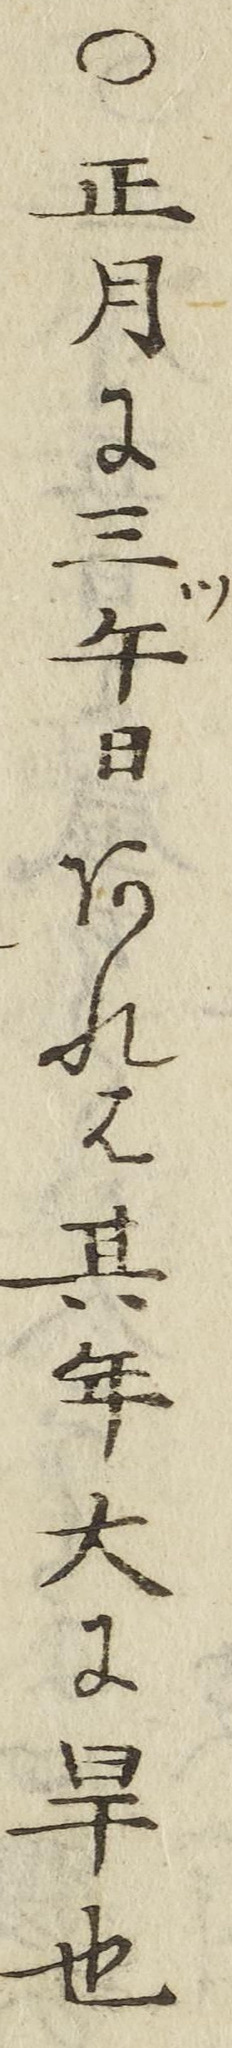〇正月に三ッ午日あれは其年大に旱也
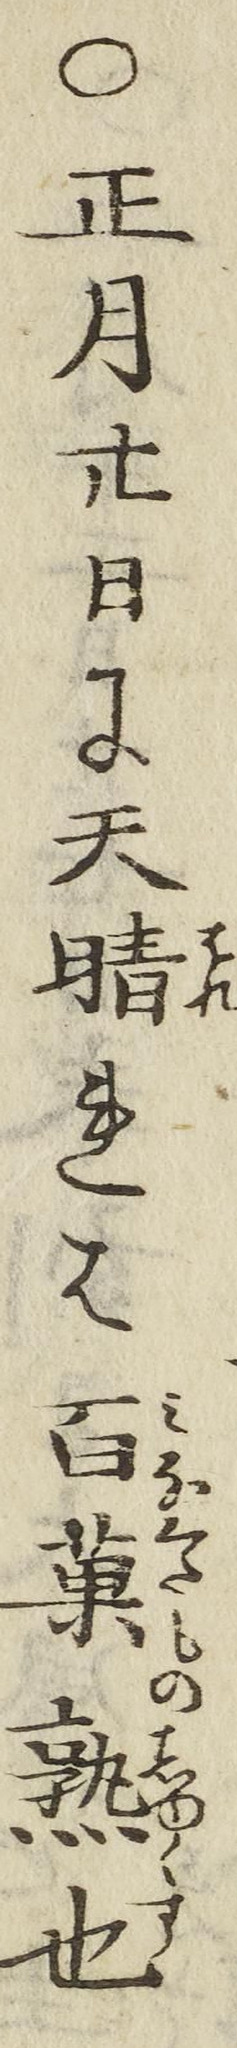〇正月廿日に天晴れは百菓熟也
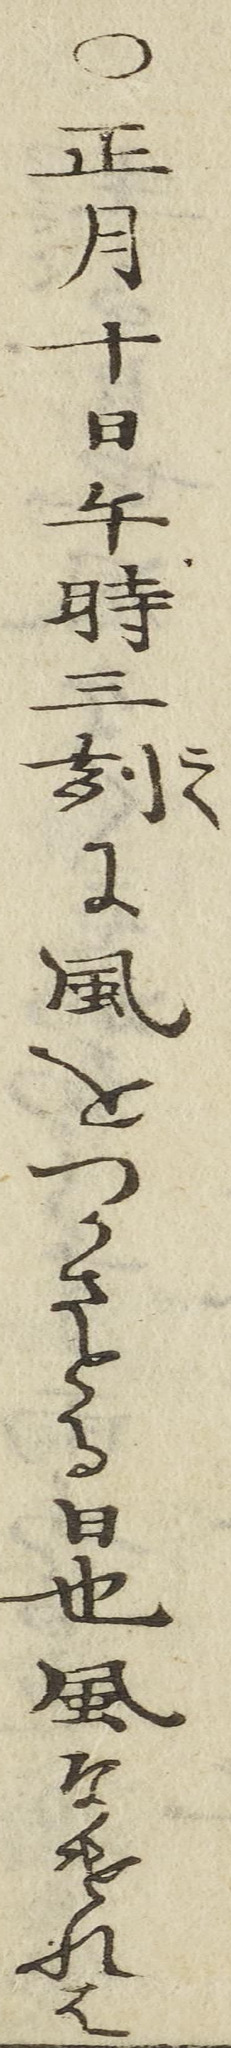〇正月十日午時三刻に風をつかさとる日也風なけれは
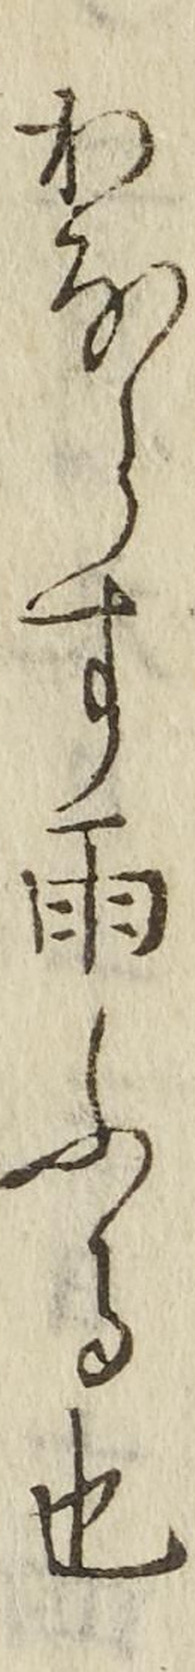かならす雨ふる也
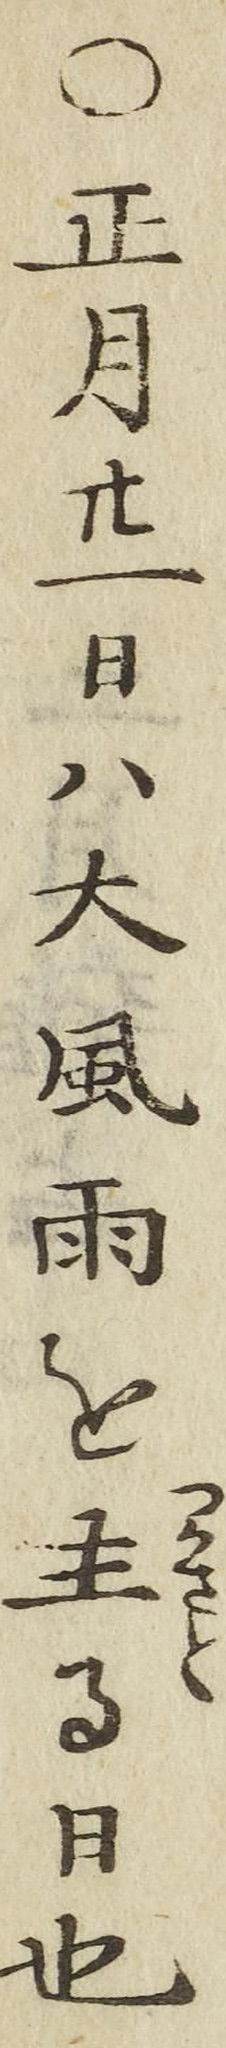〇正月廿一日は大風雨を主る日也

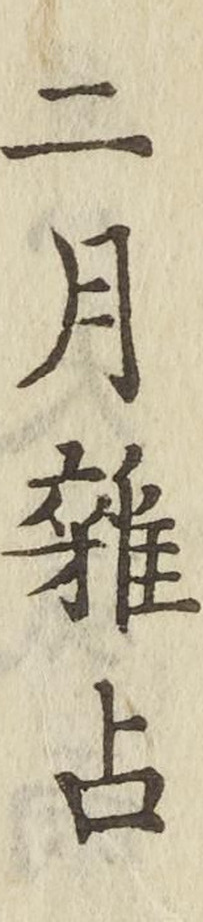二月雑占
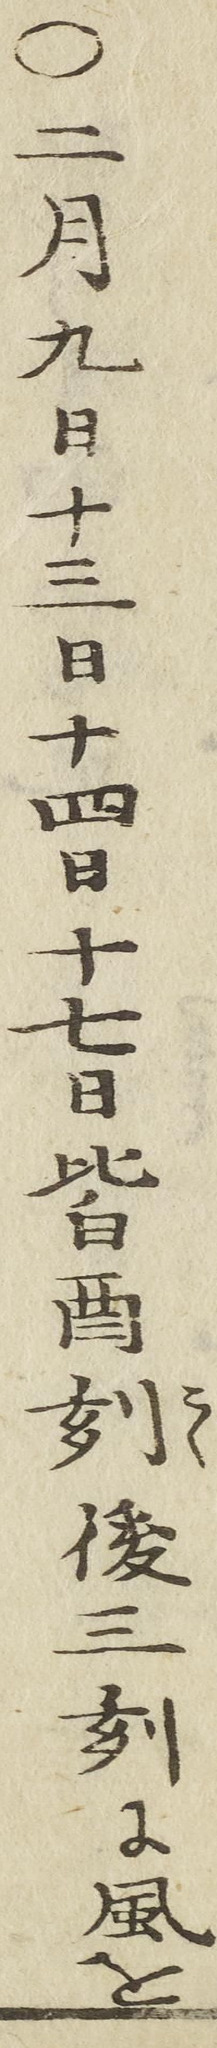○二月九日十三日十四日十七日皆酉刻後三刻に風を
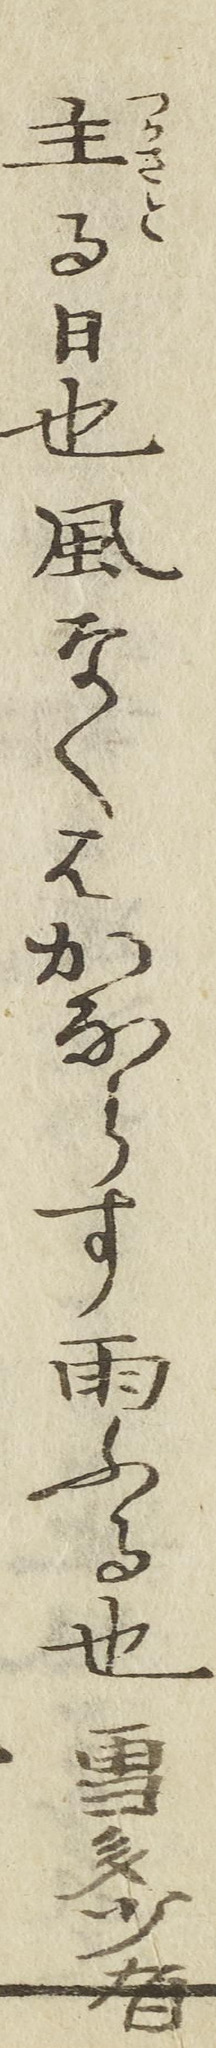主る日也風なくはかならす雨ふる也雪多少有
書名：天時占候　二
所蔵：東京大学地震研究所図書室 Earthquake Research Institute Library, The University of Tokyo, JAPAN
